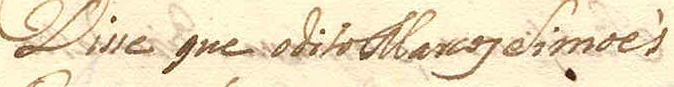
Disse que o dito Marcos Simoẽs
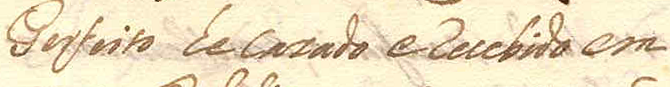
Perfeito he cazado e Recebido em
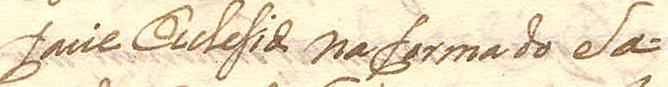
facie Ecclesiæ na forma do Sa
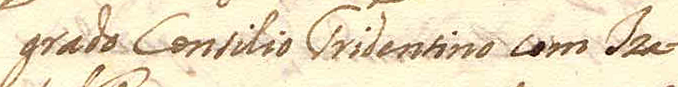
grado Consilio Tridentino com Iza
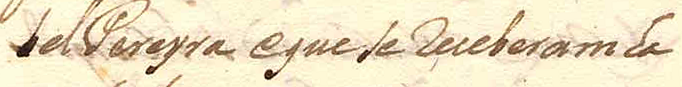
bel Pereyra e que se Receberam ha
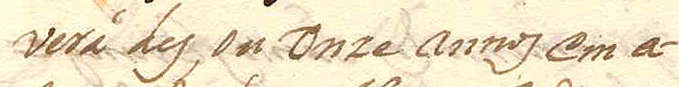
verá des, ou onze annos em a
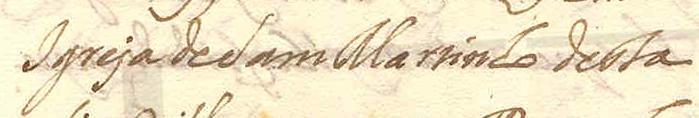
Igreja de Sam Martinho desta
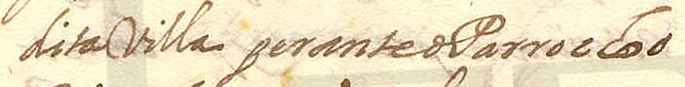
dita villa perante o Parrocho o
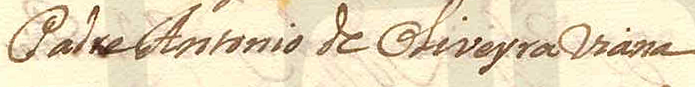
Padre Antonio de Oliveyra Viana
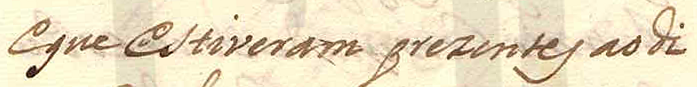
E que estiveram prezentes ao di
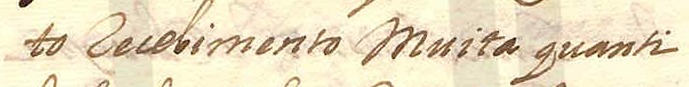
to Recebimento muita quanti
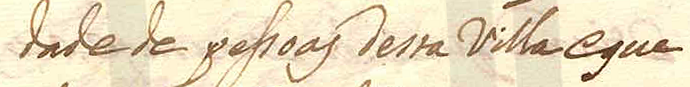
dade de pessoas desta Villa e que
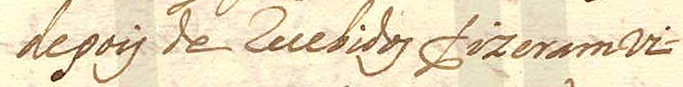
depois de Recebidos fizeram vi
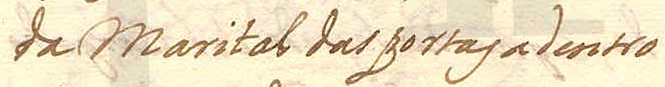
da Marital das portas adentro
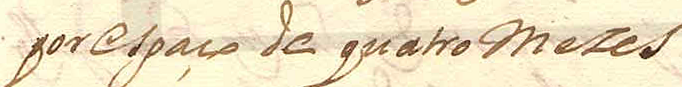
por espaço de quatro mezes
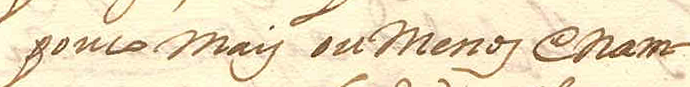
pouco mais ou menos e nam
